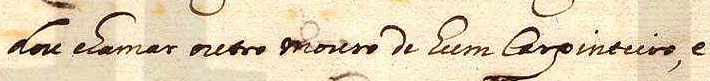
dou chamar outro mouro de hum Carpinteiro, e
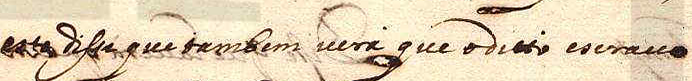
este disse que tambem uira que o ditto escrauo
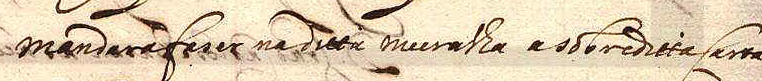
mandara faser na ditta muralha a sobreditta Carta
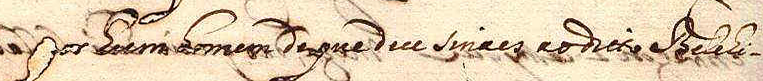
_or hum homem de que deu sinaes ao ditto Belchi
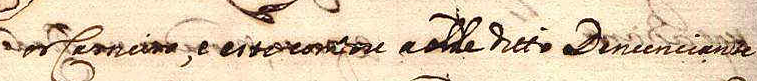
or Carneiro, e este con_ou a elle ditto Denunciante
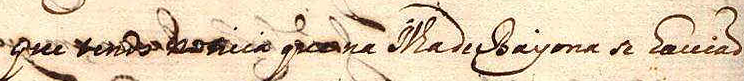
que tendo noticia que na Ilha de Bayona se hauiaõ
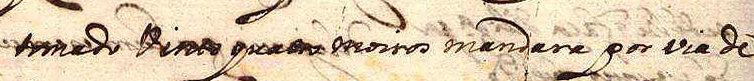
tomado Vinte quatro moiros mandara por via de
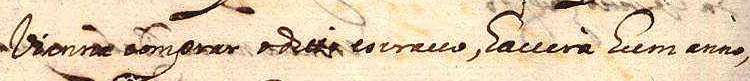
Vianna comprar o ditto escrauo, hauerà hum anno,
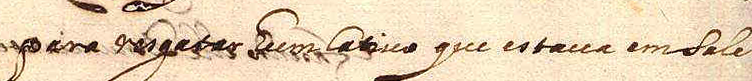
para resgatar hum Catiuo que estaua em Sale
